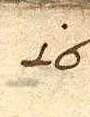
16
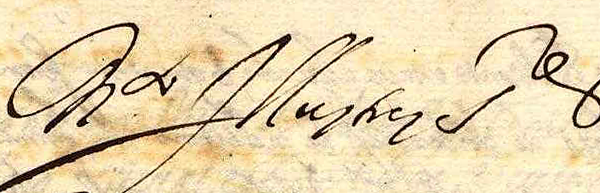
M.to Jllustres Sres
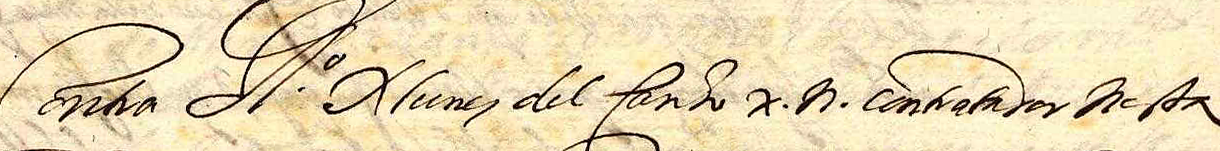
Contra R.o Nunes del Canho x. n. contratador nesta
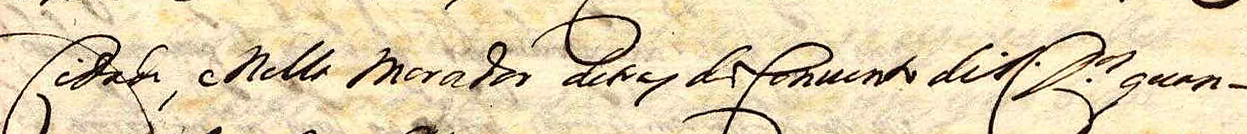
Cidade, e nella morador detras do Conuento de S. D.os quan
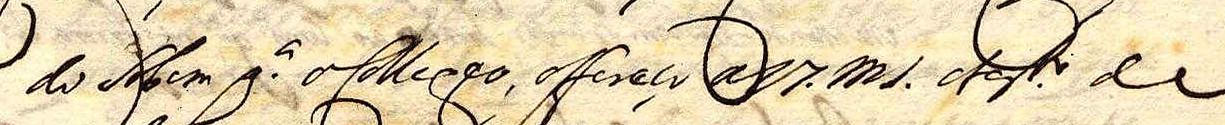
do sobem p.a o Collegeo, offereço a vs. ms. o tes.to de
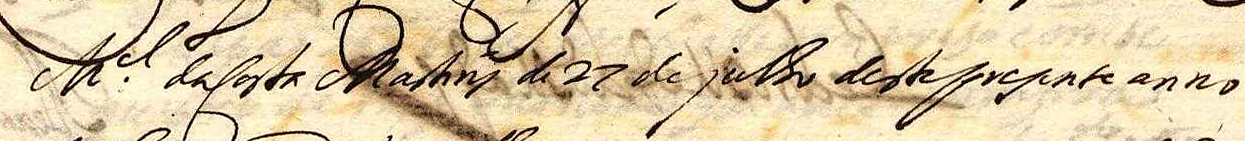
M.el da Costa Martins de 27 de julho deste presente anno
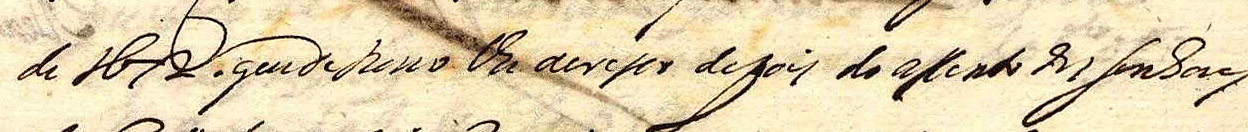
de 1672. que de nouo lhe acresce depois do assento dos senhores
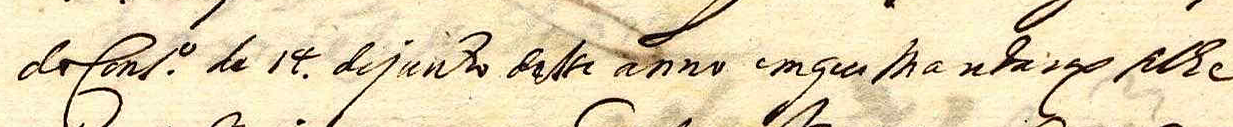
do Cons.o de 14 de junho deste anno em que mandaraõ se lhe
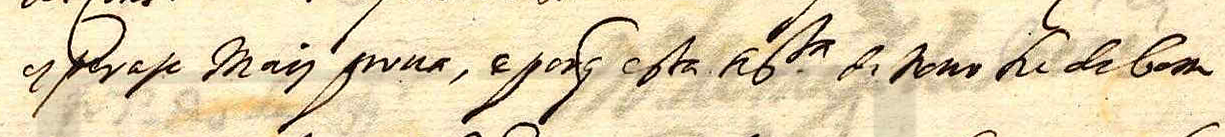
esperase Mais proua, e porq̄ esta tes.ta de nouo he de bom
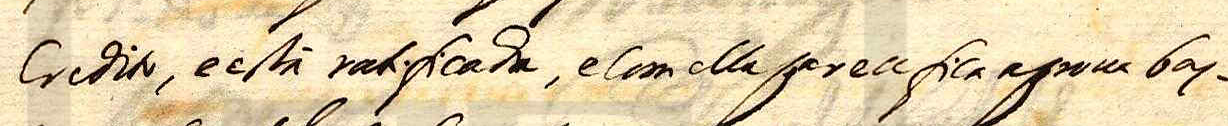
Credito, e está ratificada, e com ella parece fica a proua bas
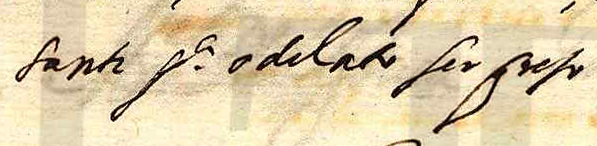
tante p.a o delato ser preso
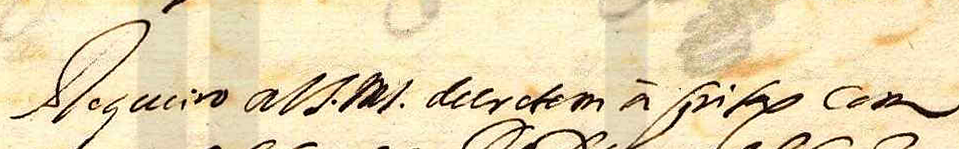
Requeiro a Vs. ms. decretem a prisaõ com
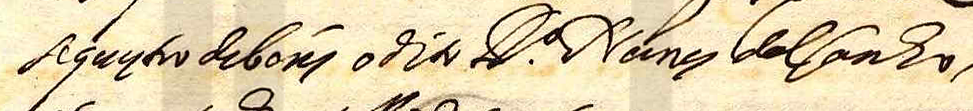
sequestro de ben̄s o dito R.o Nunes del Canho,
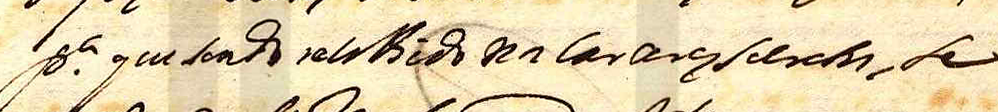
p.a que sendo recolhido nos carceres secretos, se
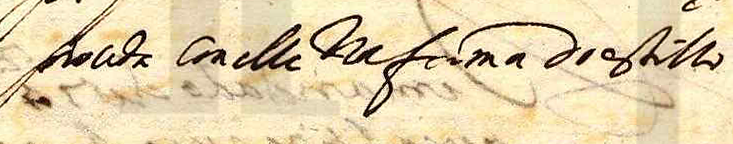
proceda con elle na forma do estillo
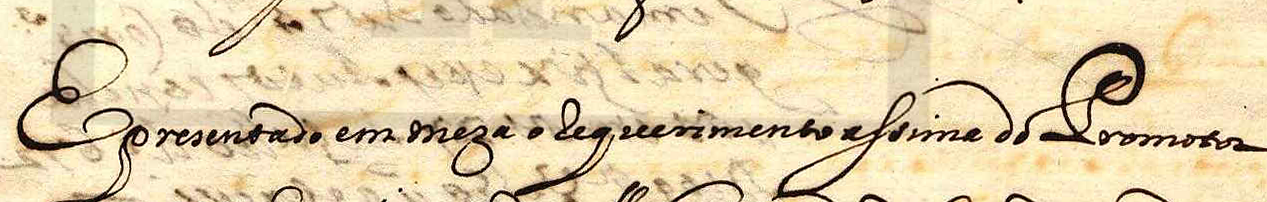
E presentado em meza o Requerimento assima do Promotor
